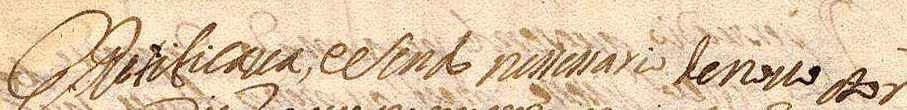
E Retificaua, e Sendo nessessario de nouo o tor
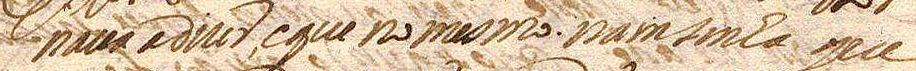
naua a dizer, e que no mesmo. nam tinha que
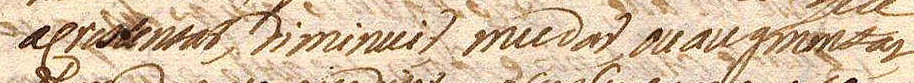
aCrescentar, diminuir, mudar, ou augmentar
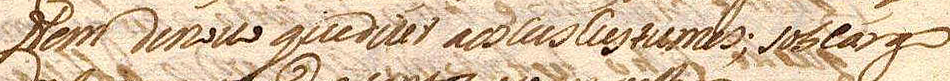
Nem de nouo que dizer aos cus custumes; sob cargo
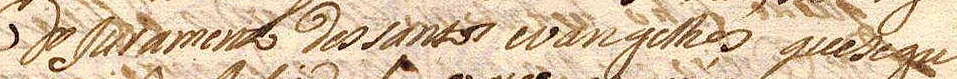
do Iuramento dos santos evangelhos que segu
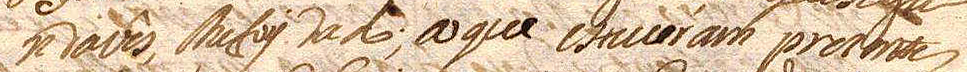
nda vês, lhe foy dado; a que estiueram prezentes
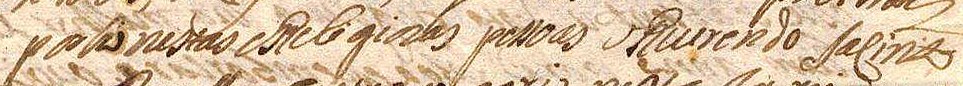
por honestas e Religiozas pessoas o Reurendo JaCinto
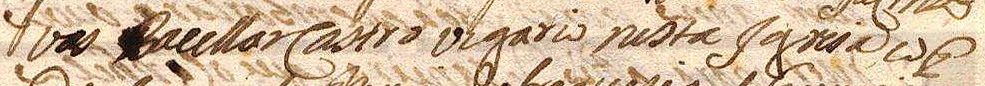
vas Bacellar Castro vigario nesta Jgreia e o P
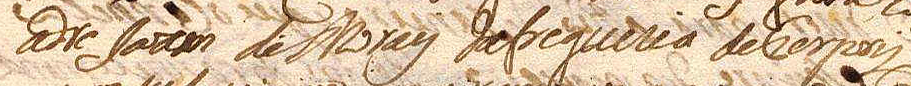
adre Joam de Moraes da freguezia de Terporiz
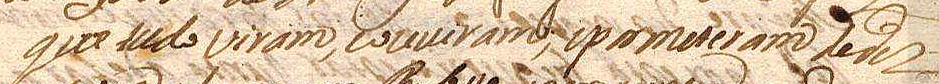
que tudo viram, e ouuiram, e pormeteram de diz
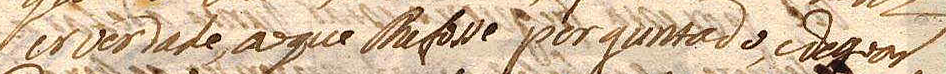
er verdade, ao que lhe fosse perguntado e de goar
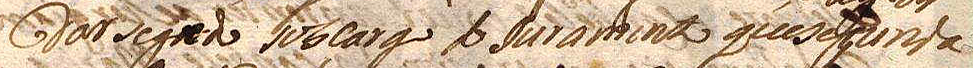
dar segredo sob cargo do Iuramento que segunda
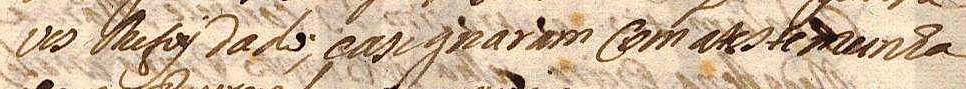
ves lhe foy dado; e asignaram Com a testemunha
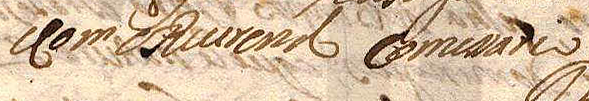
e Com o Reurendo Comessario
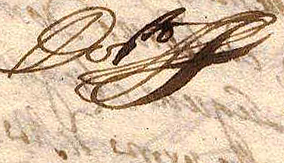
Do s.to
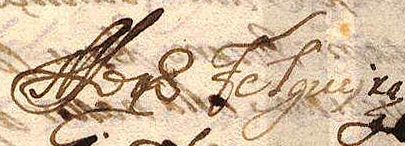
Joaõ Felguejra
